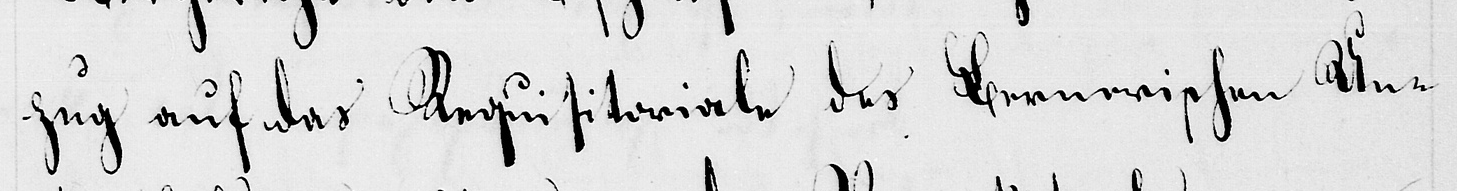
zug auf das Requisitoriale des Bernerischen Un¬
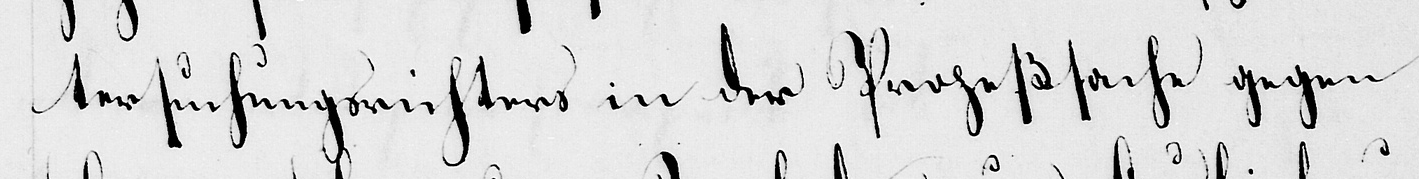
tersuchungsrichters in der Prozeßsache gegen
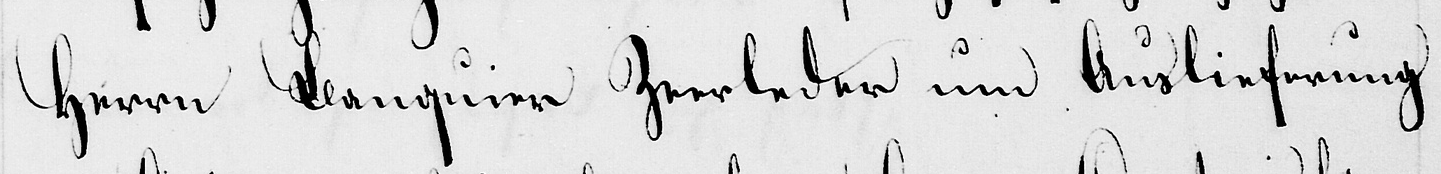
Herrn Banquier Zeerleder um Auslieferung
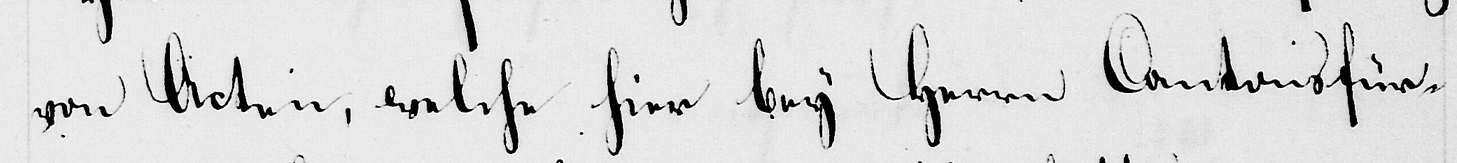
von Acten, welche hier bey Herrn Cantonsfür¬
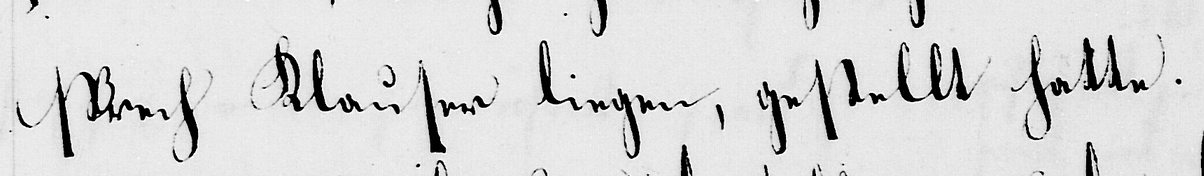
sprech Klauser liegen, gestellt hatte.
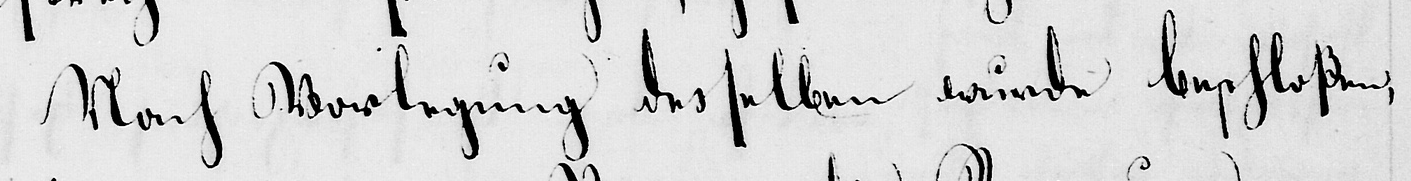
Nach Vorlegung desselben wurde beschloßen,
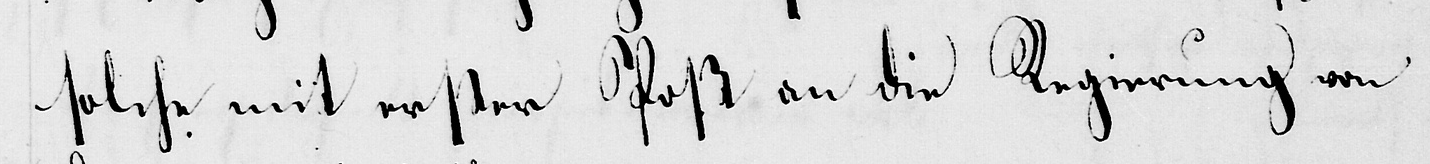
solche mit erster Post an die Regierung von
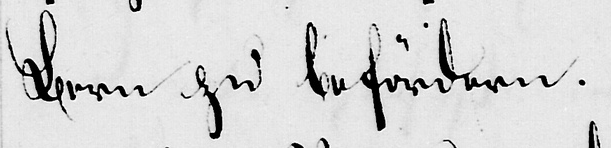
Bern zu befördern.
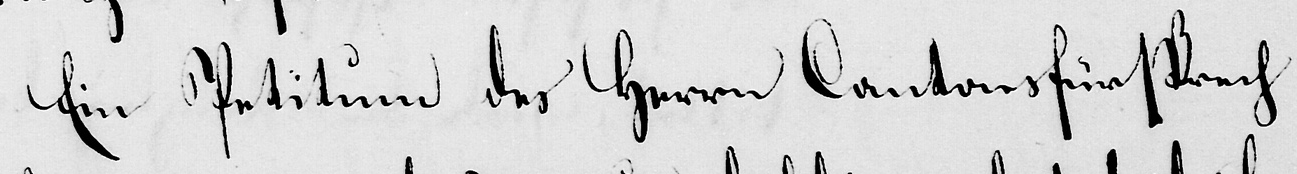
Ein Petitum des Herrn Cantonsfürsprech
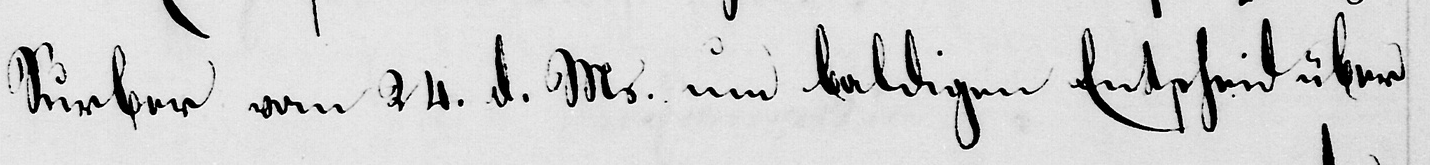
Surber vom 24. d. Ms. um baldigen Entscheid über
